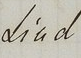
ist nun
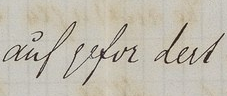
aufgefordert
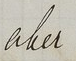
solche
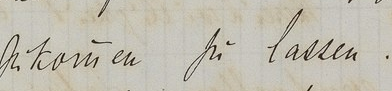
zukommen zu lassen.
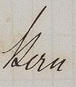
Von
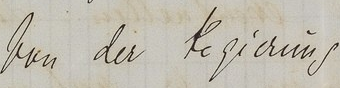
Bern ist ein Schrei-
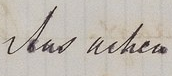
ben eingelangt
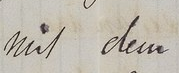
mit dem
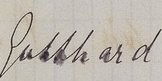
Gotthard
